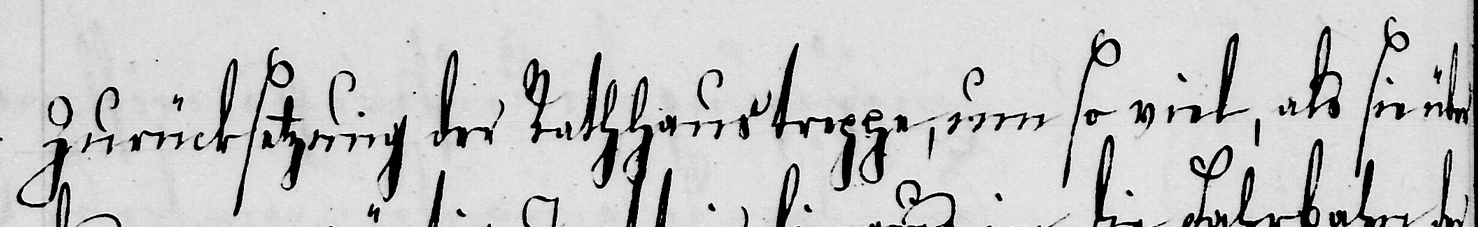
Zurücksetzung der Rathhaustreppe, um so viel, als sie
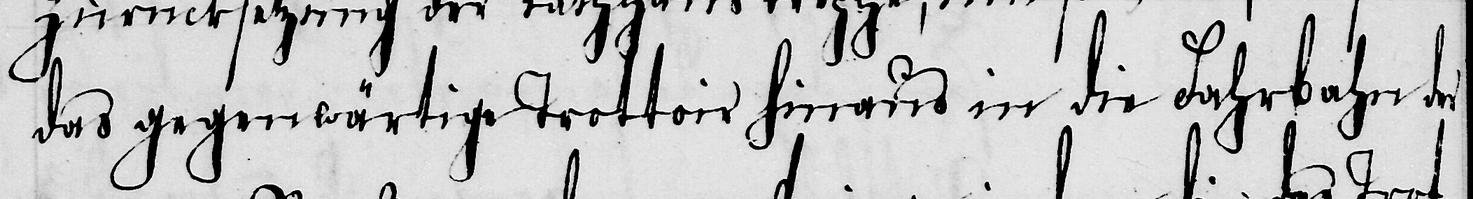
das gegenwärtige Trottoir hinaus in die Fahrbahn der
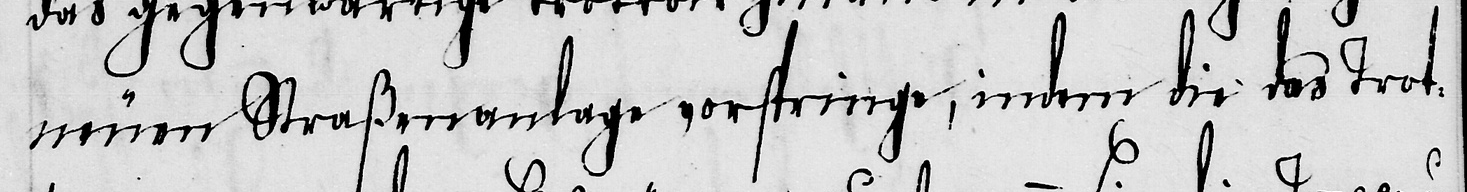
neuen Straßenanlage vorspringe, indem die das Trot¬
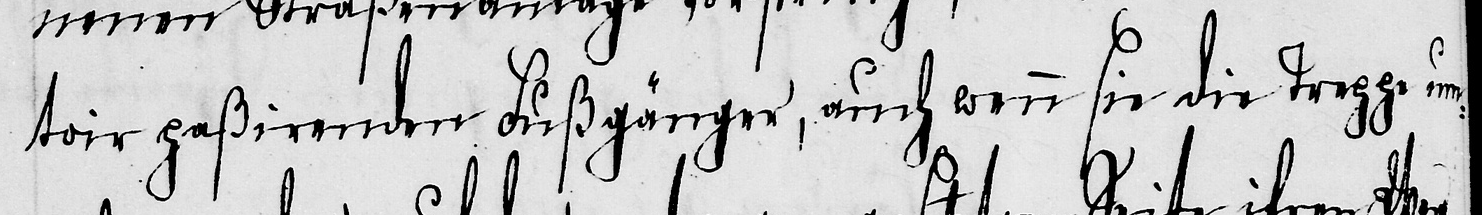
toir paßirenden Fußgänger, auch wenn sie die Treppe um¬
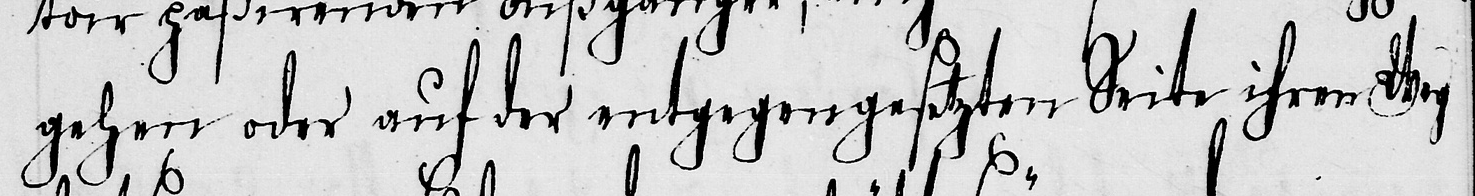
gehen oder auf der entgegengesetzten Seite ihren Weg
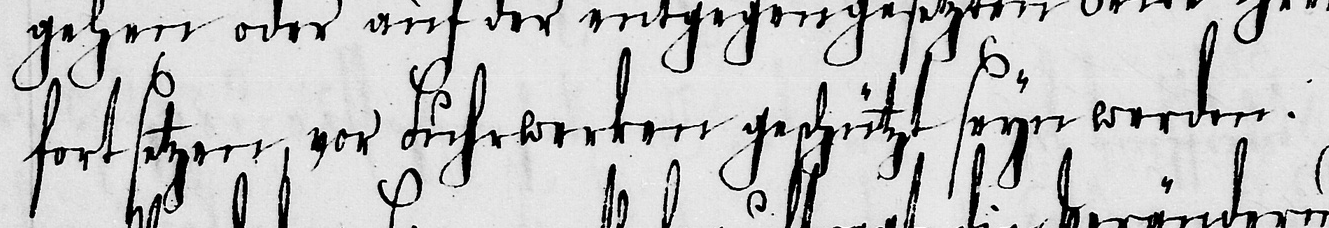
setzen, vor Fuhrwerken geschützt seyn werden.
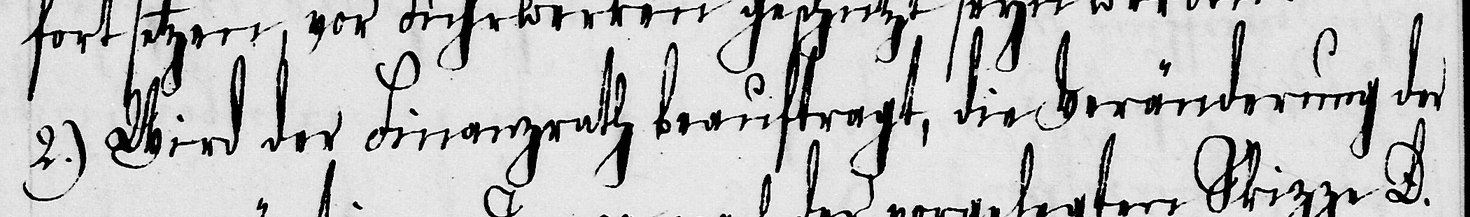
2.) Wird der Finanzrath beauftragt, die Veränderung der
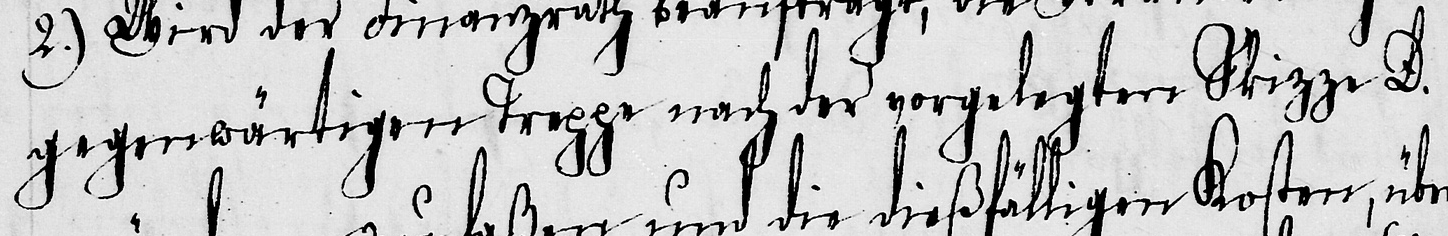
gegenwärtigen Treppe nach der vorgelegten Skizze D.
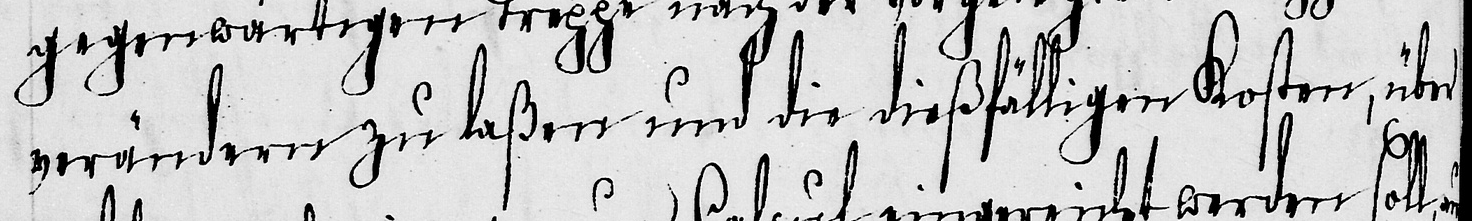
verändern zu laßen und die dießfälligen Kosten, üb¬
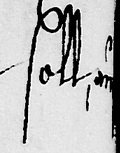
soll,
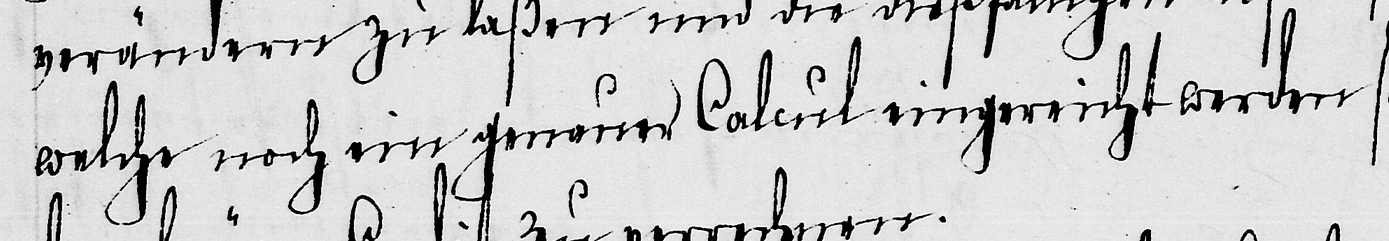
welche noch ein genauer Calcul eingereicht werden
